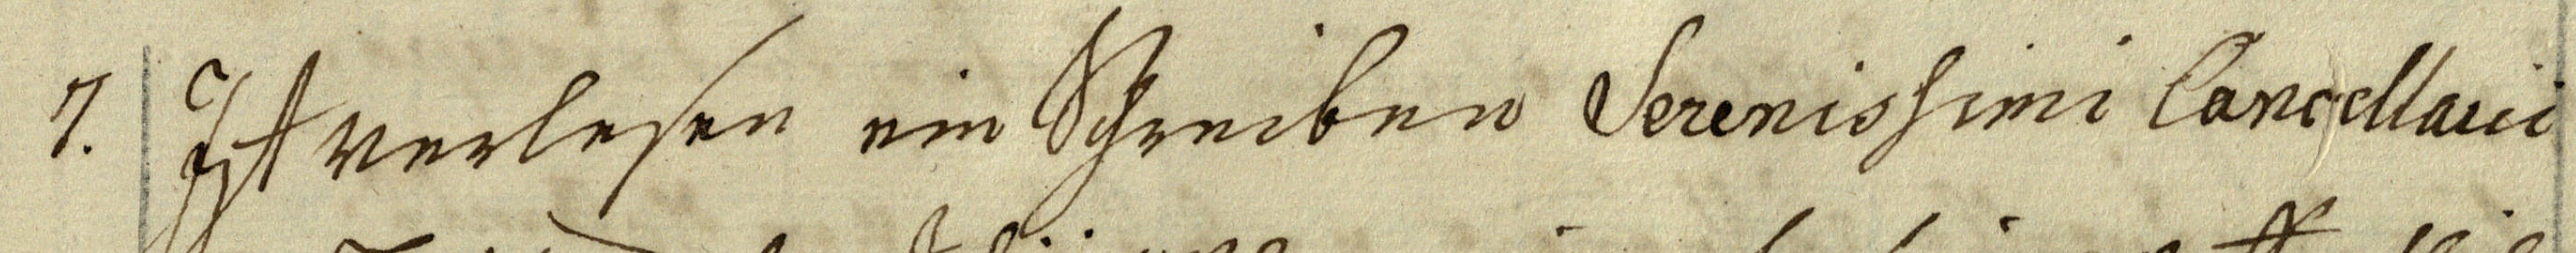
7. Ist verlesen ein Schreiben Serenissimi Cancellarii
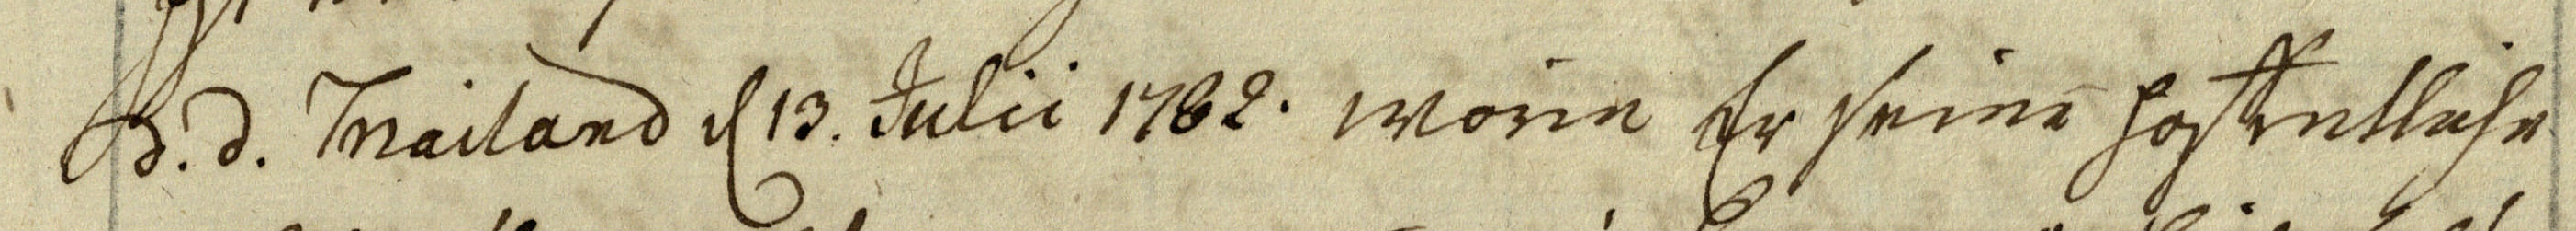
d. d. Mailand d. 13. Julii 1782. worin Er seine hoffentliche
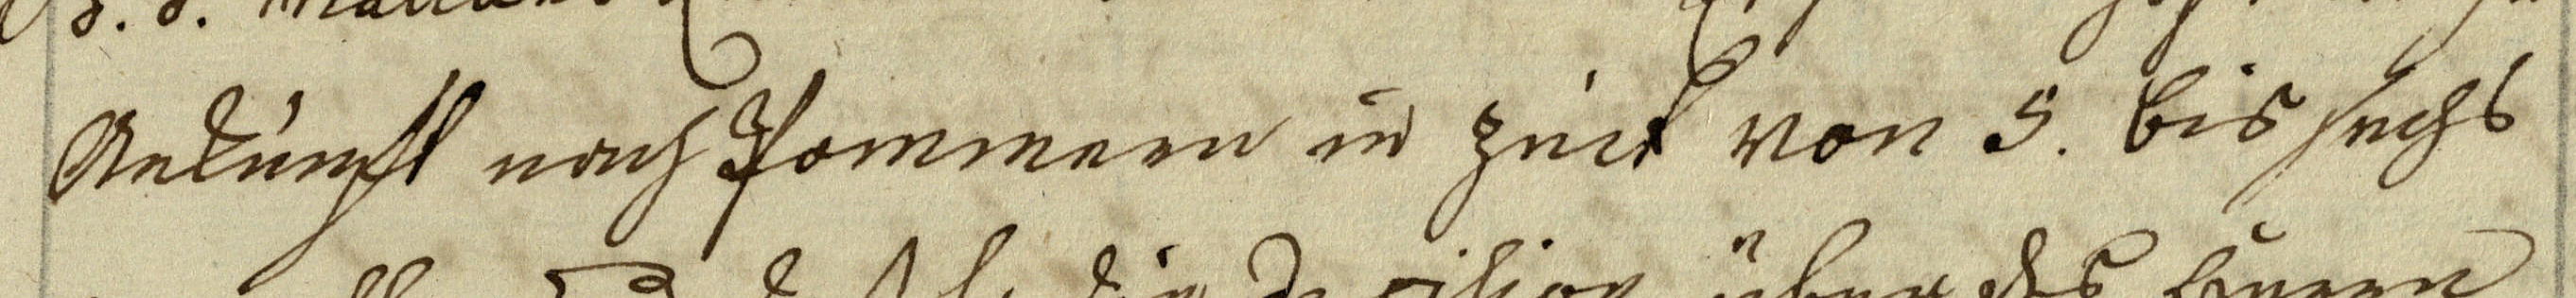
Ankunft nach Pommern in zeit von 5. bis sechs
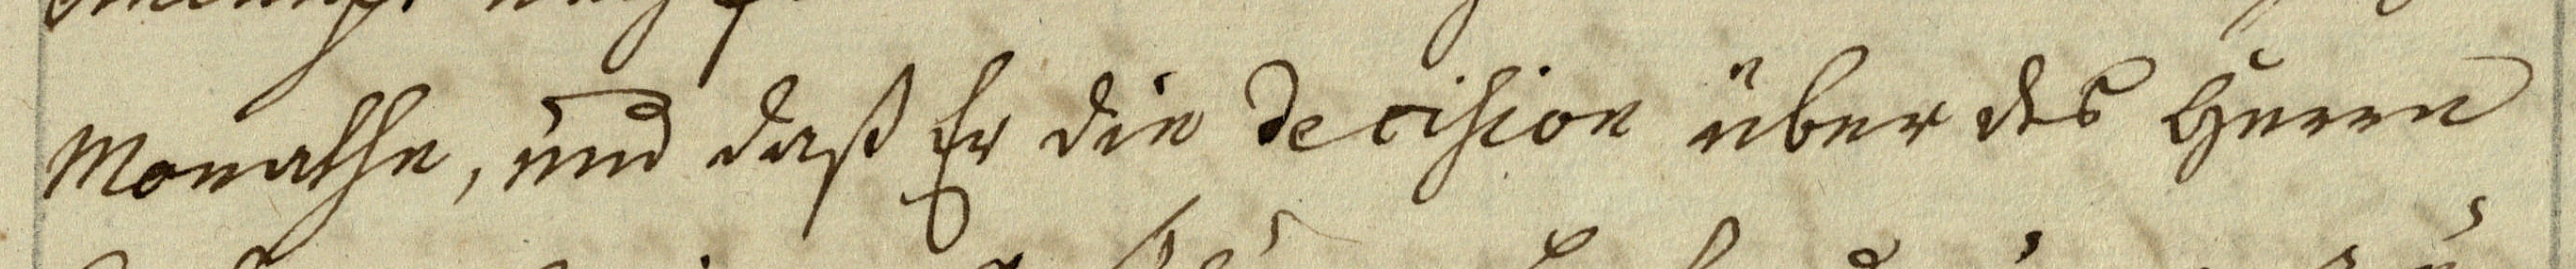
Monathe, und daß Er die decision über des Herrn
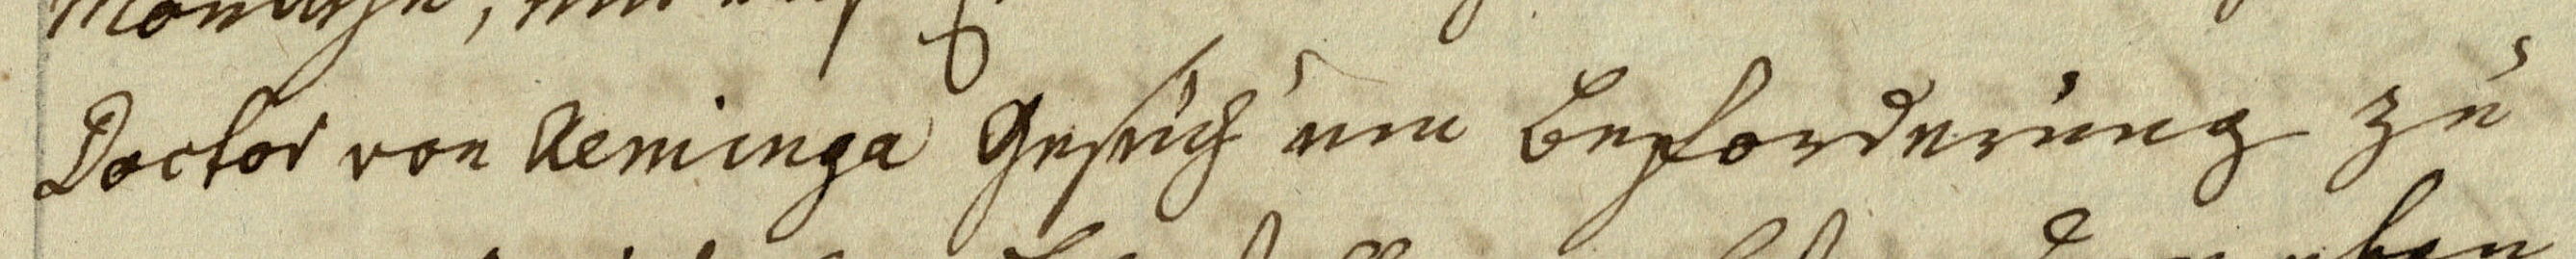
Doctor von Aeminga Gesuch um Beforderung zu
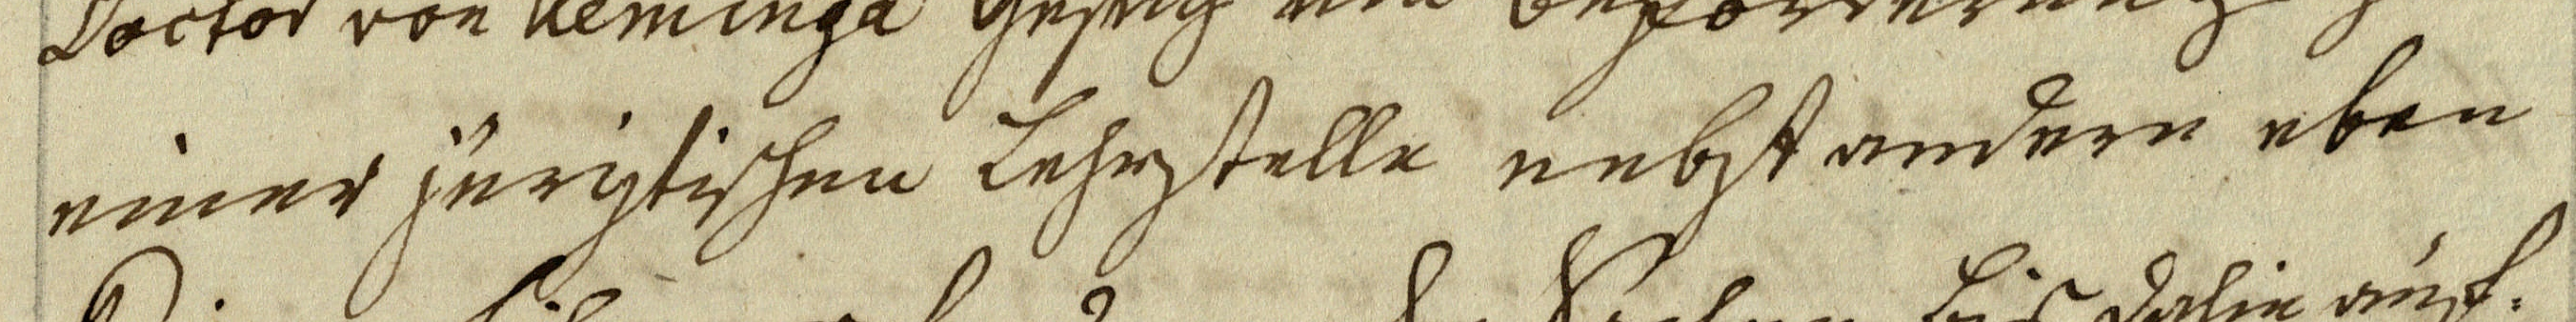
einer juristischen Lehrstelle nebst andern eben
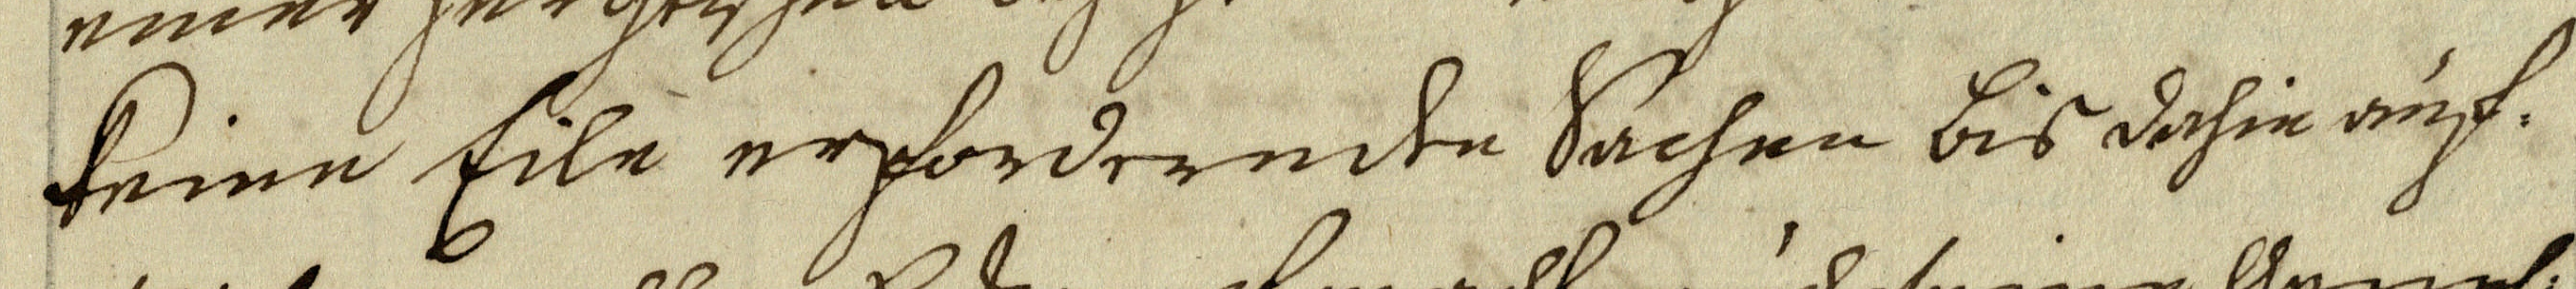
keine Eile erfordernden Sachen bis dahin auf¬
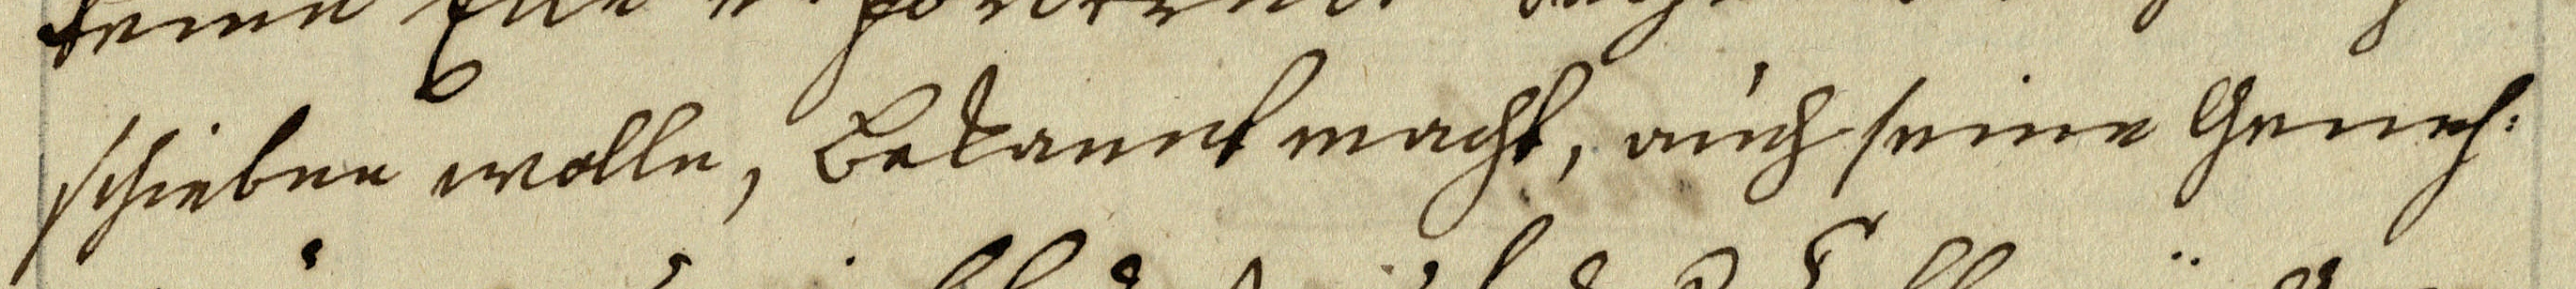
schieben wolle, bekannt macht, auch seine Geneh¬
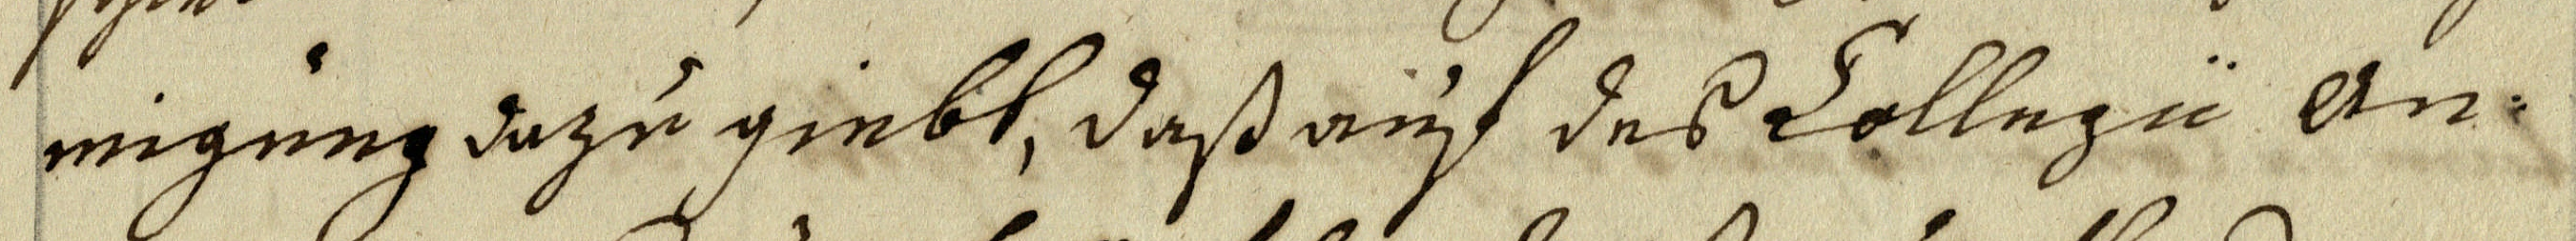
migung dazu giebt, daß auf des Collegii An¬
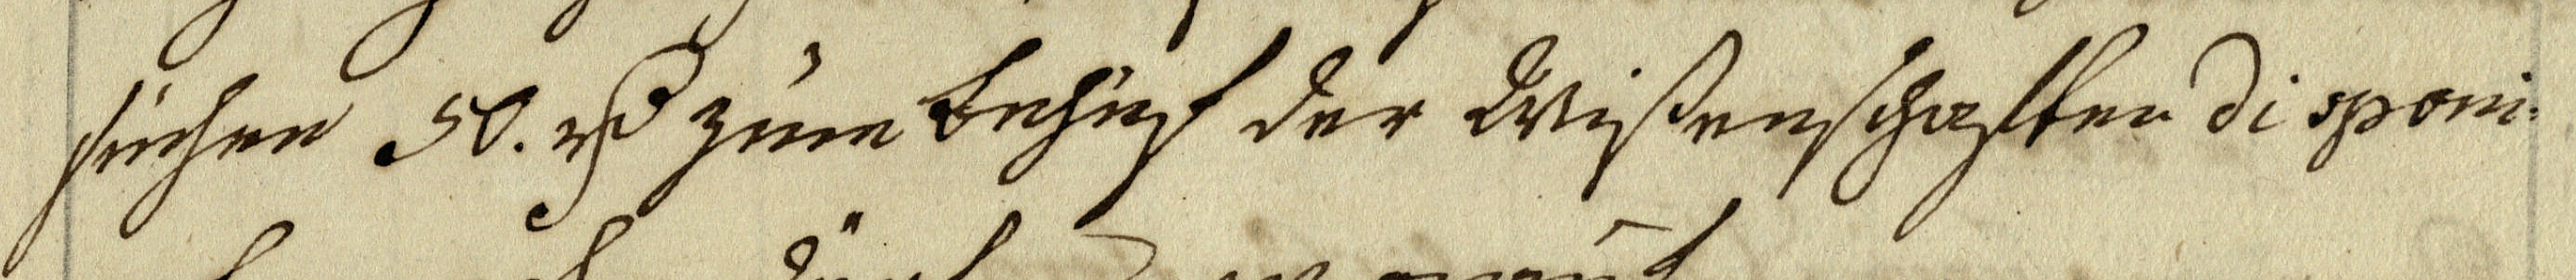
suchen 50. r. zum Behuf der Wissenschaften disponi¬
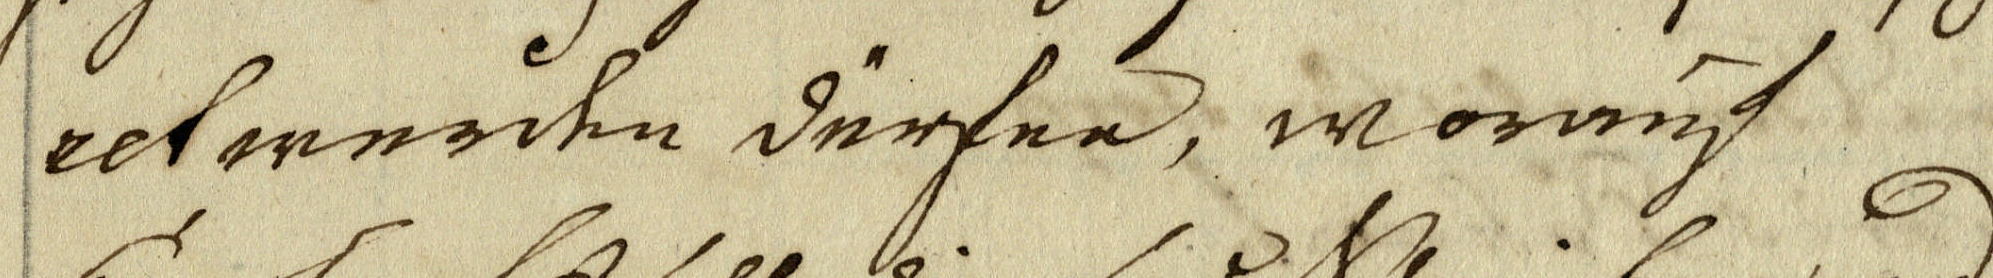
ret werden dürfen, worauf
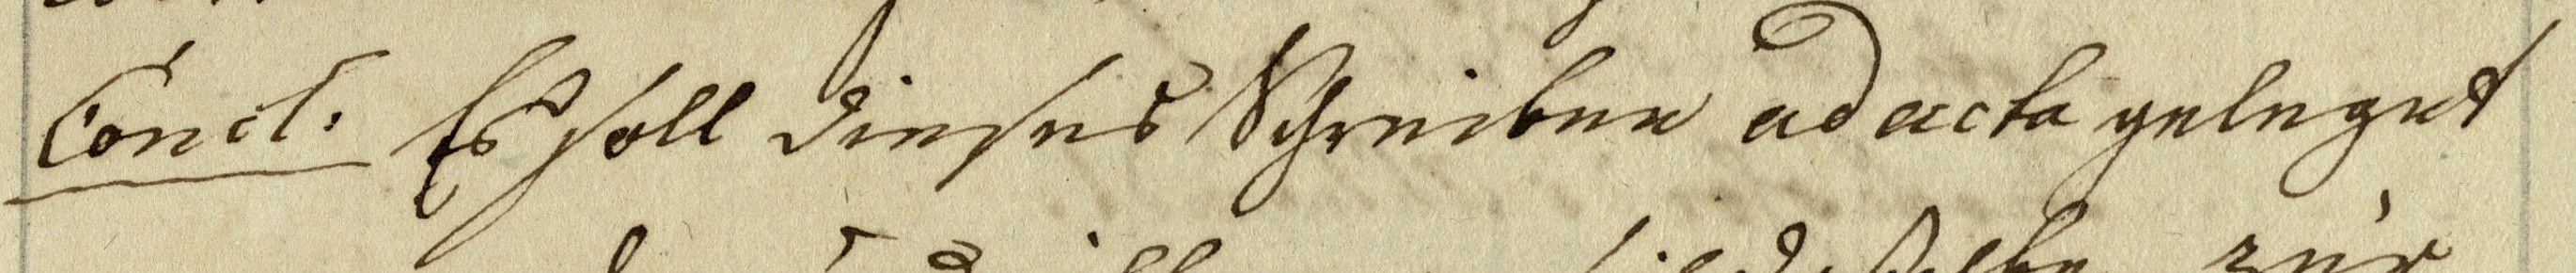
Concl. Es soll dieses Schreiben ad acta geleget
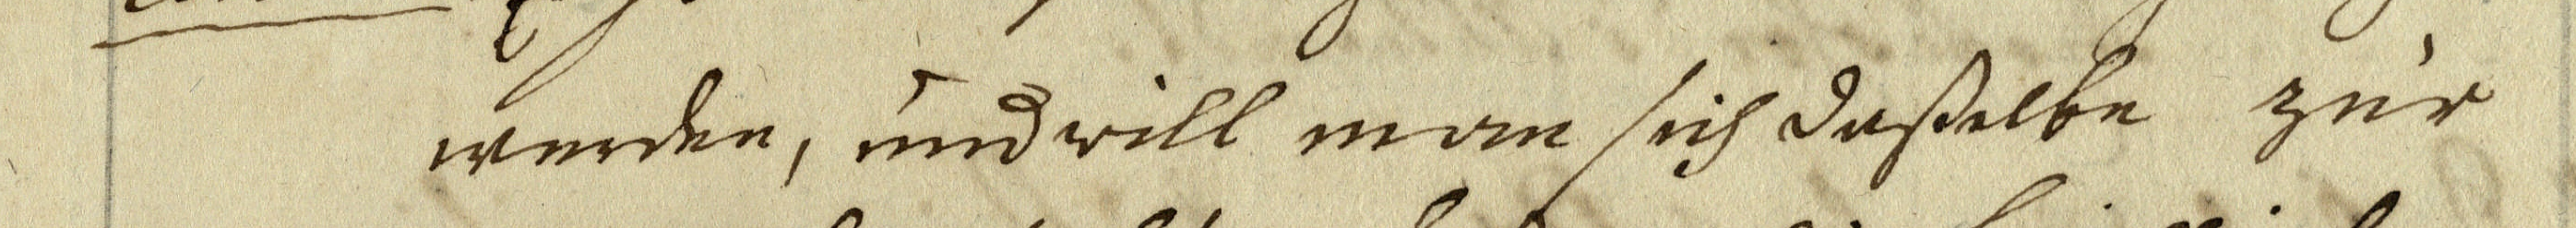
werden, und will man sich daßelbe zur
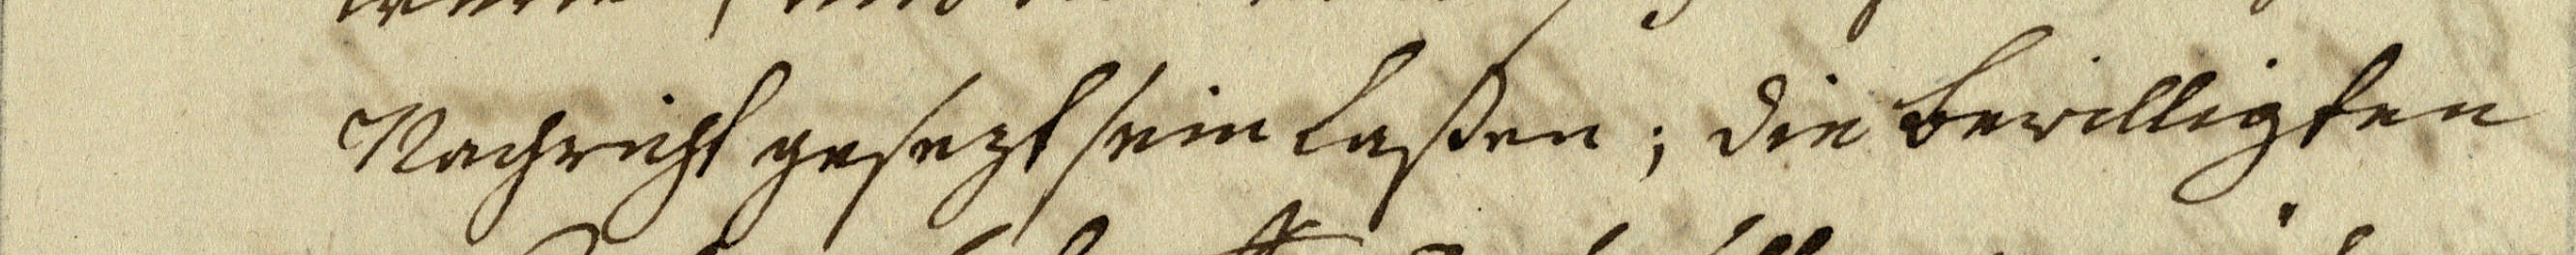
Nachricht gesezt sein lassen; die bewilligten
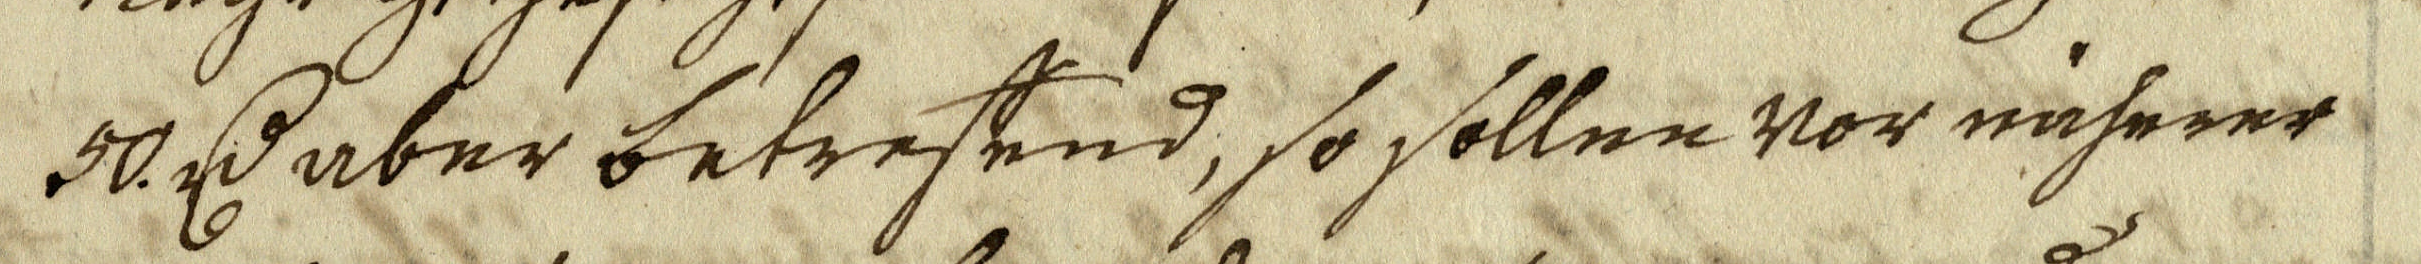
50 r. aber betreffend, so sollen vor näherer
